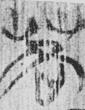茖
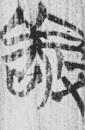敬
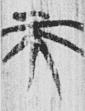天
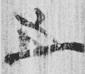之
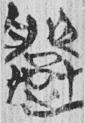○（與）
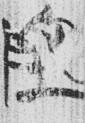地
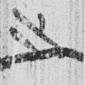之
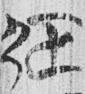弡
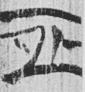亙（恒）
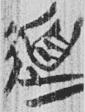道
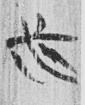必
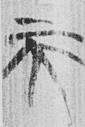天
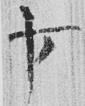才（哉）
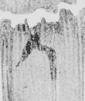人
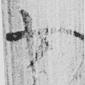才（哉）
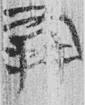倗（凭）
